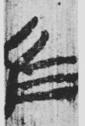於
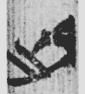此
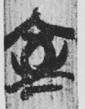室
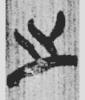之
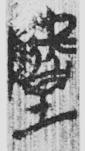○（階）
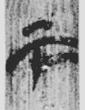下
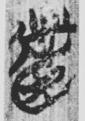○（僕）
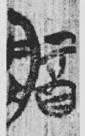𨟻（將）
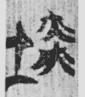埮（掩）
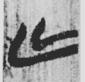亡
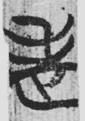○（老）
